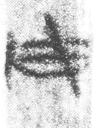母
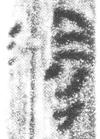善
